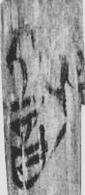○（察）
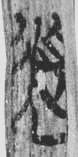道
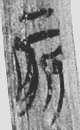所
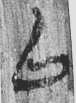㠯（以）
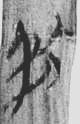攸（修）
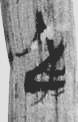身
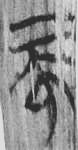而
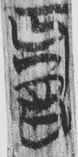○（治）
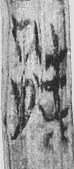邦
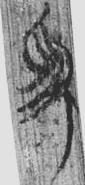○（家）
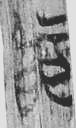○（聞）
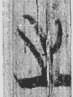之
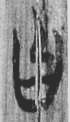曰
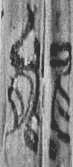能
